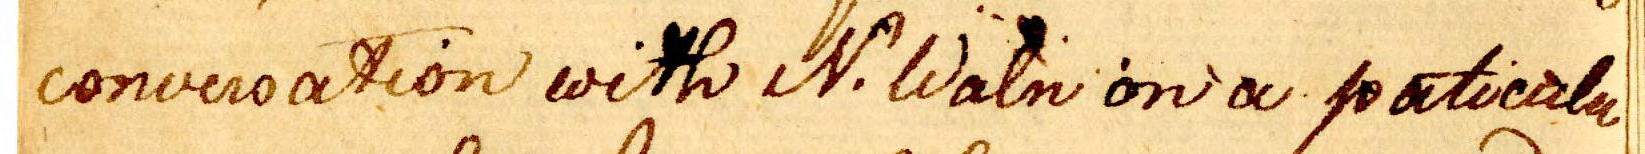conversation with N. Waln on a paticula
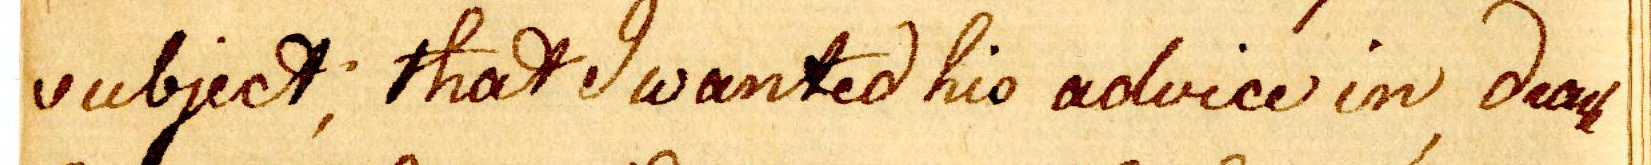subject, that I wanted his advice in drank
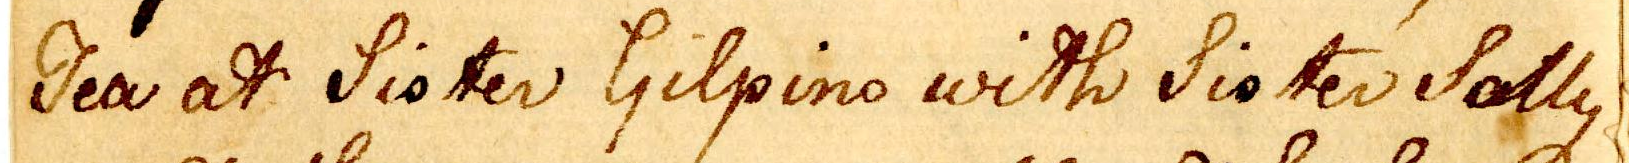Tea at Sister Gilpins with Sister Sally
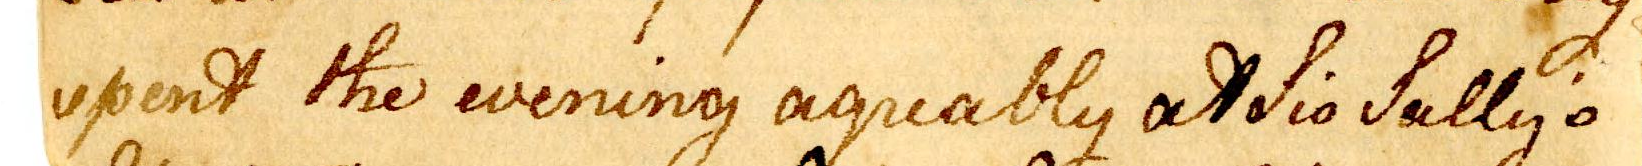spent the evening agreably at Sis Sally's
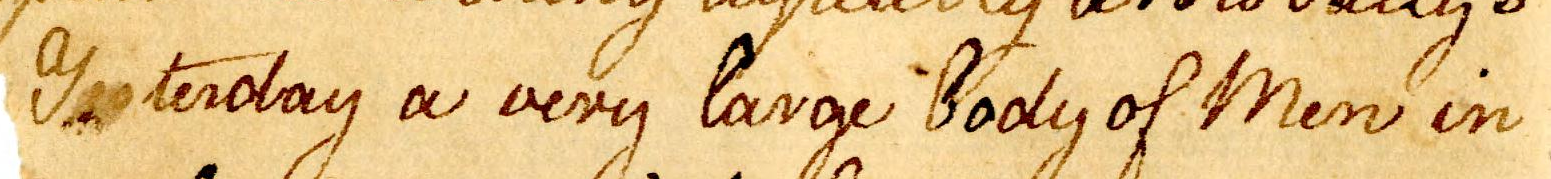Yesterday a very large body of Men in
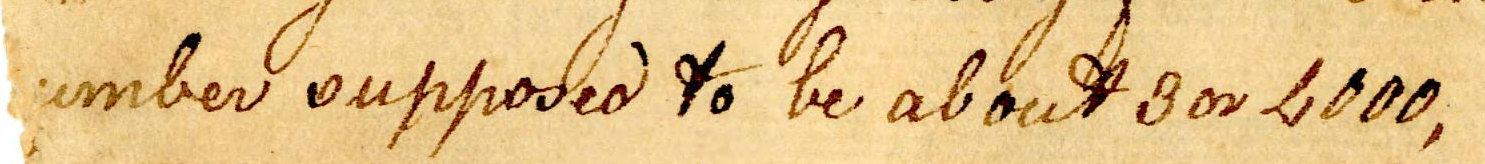umber supposed to be about 3 or 4000,
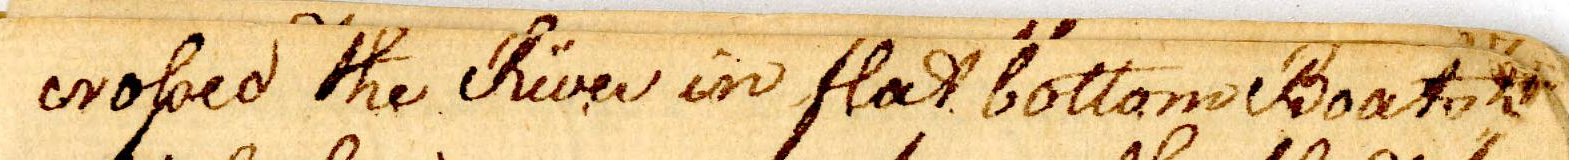crossed the River in flat bottom Boats 21
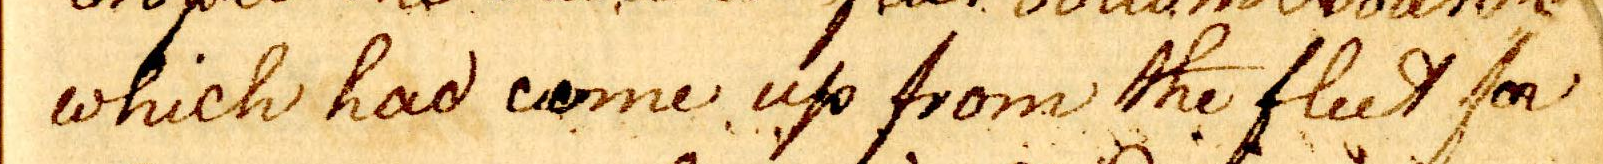which had come up from the fleet for
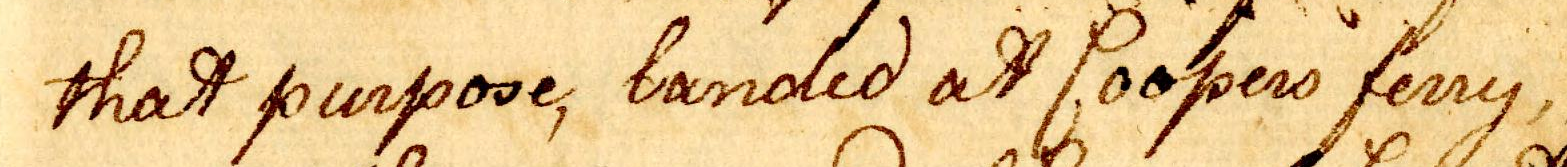that purpose, landed at Coopers ferry,
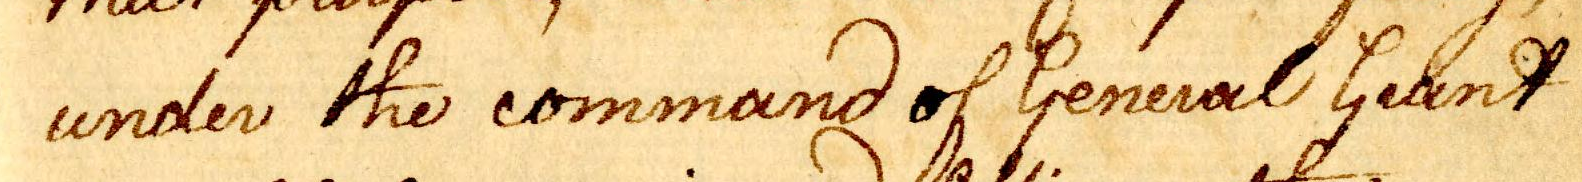under the command of General Grant
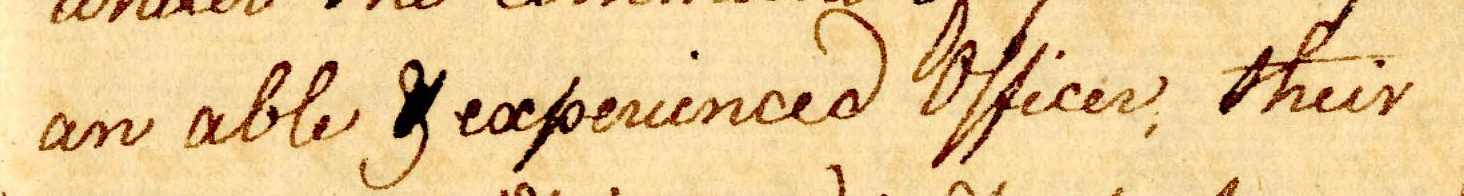an able & experienced Officer their
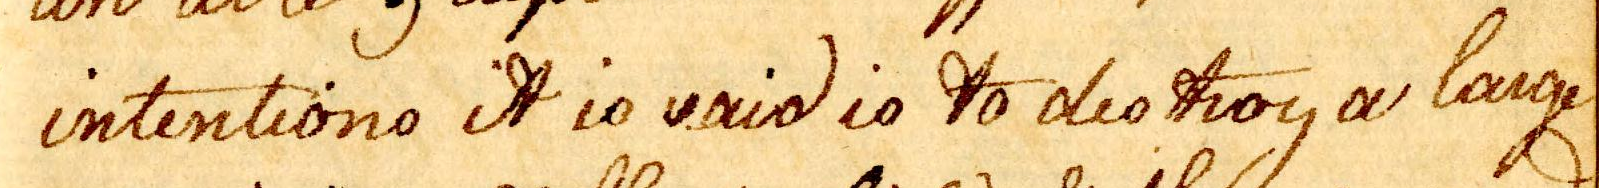intentions it is said is to destroy a large
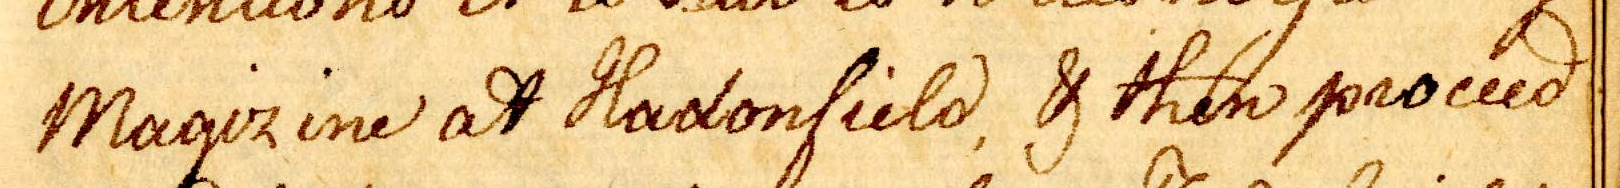Magizine at Hadonfield, & then proceed
